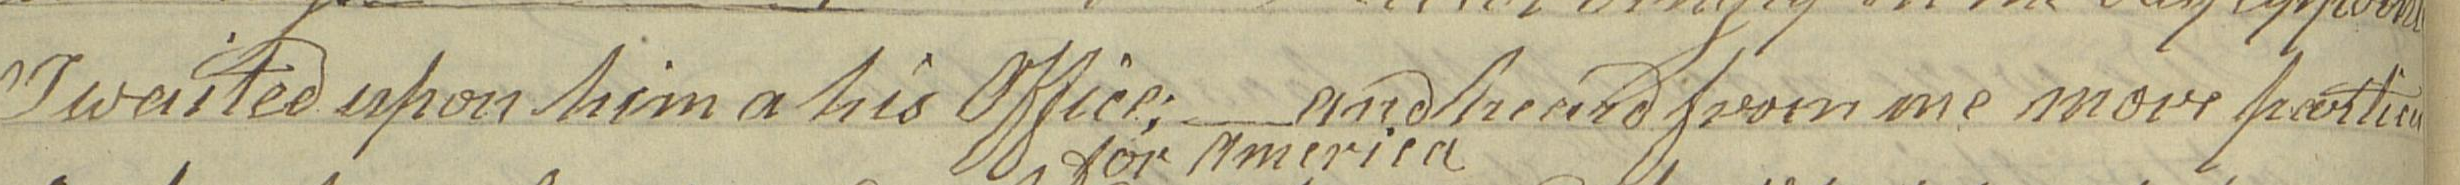I waited upon him a his Office; and sheard from me more parti-
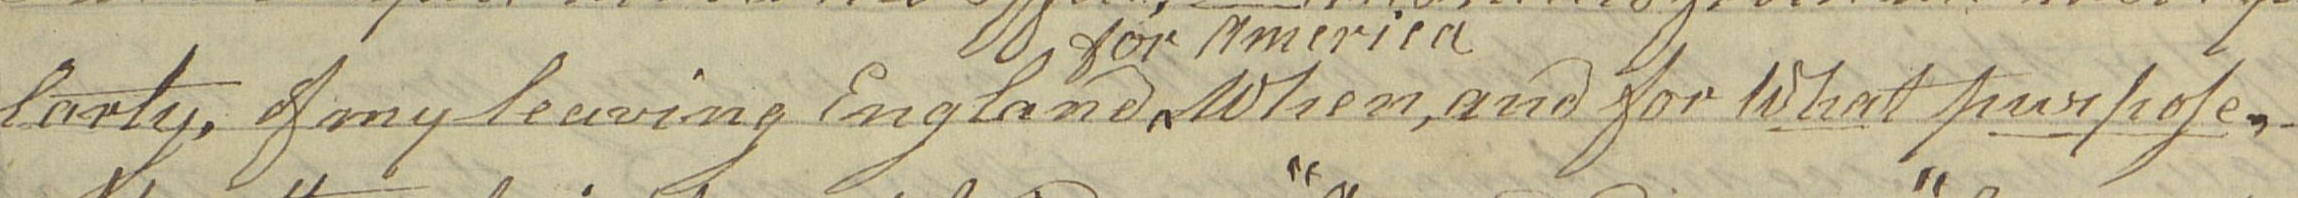-larty. of my leaving England ^ When, and for what purpose,
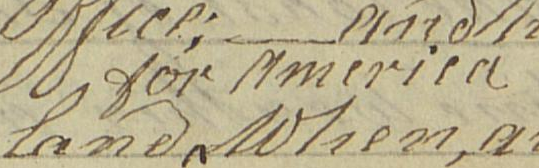for America
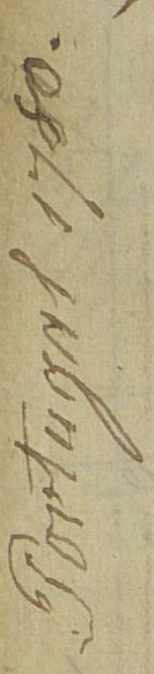Portugal 1780
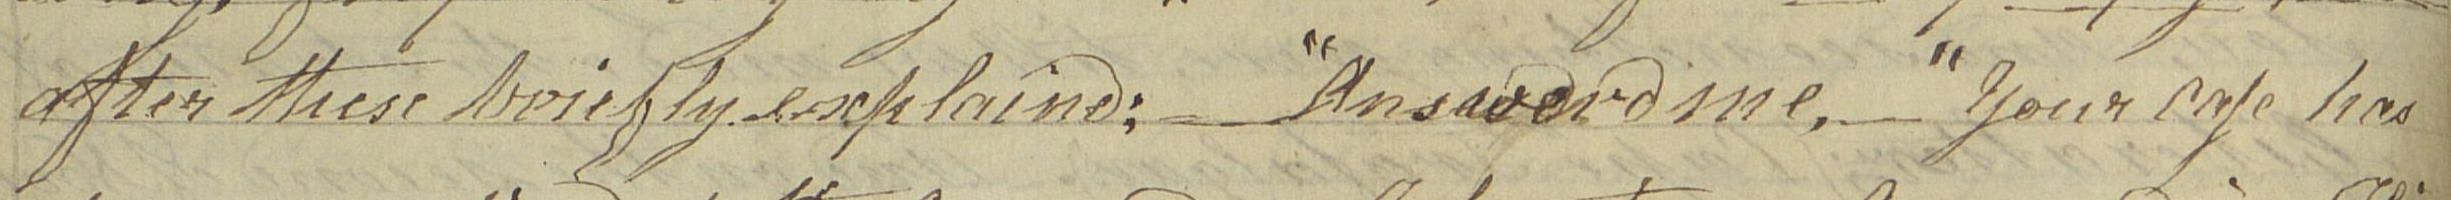after these briefly explaind: "Answerd me. "Your Case has
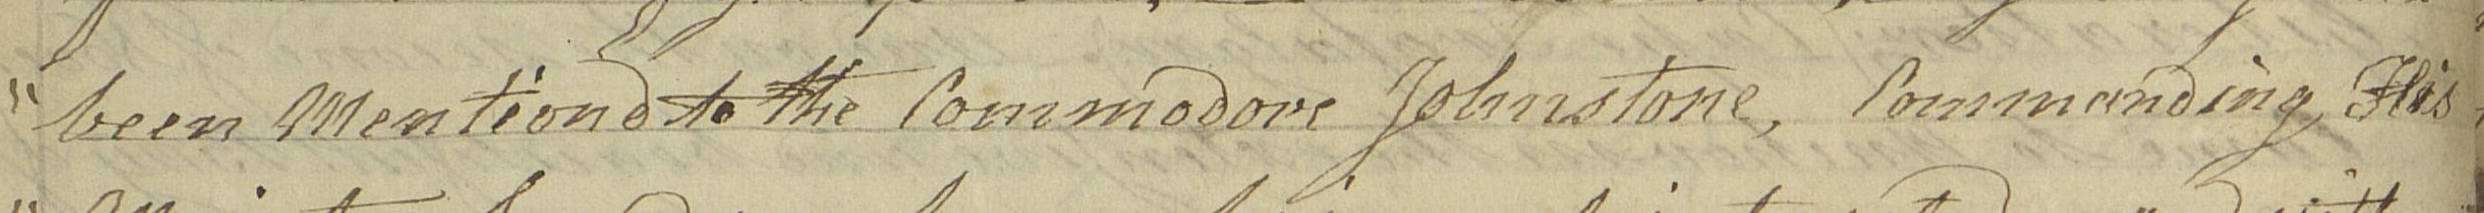been Mentiond to the Commodore Johnstone, Commanding His
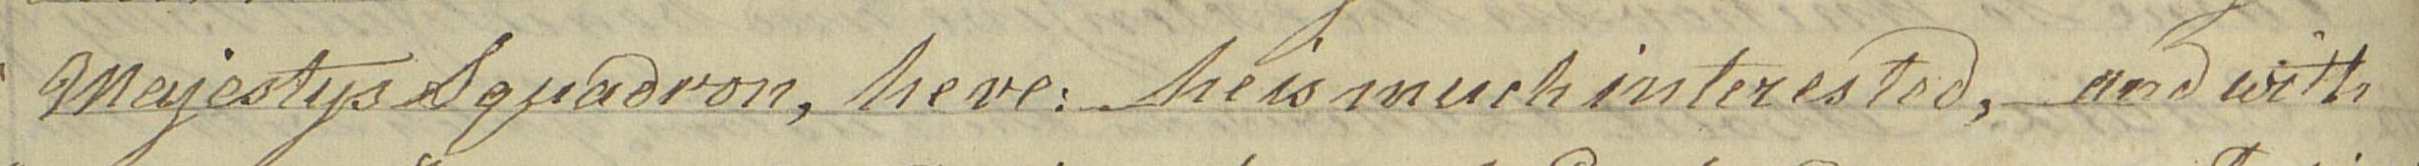Majestys Squadron, here. he is much interested, and with
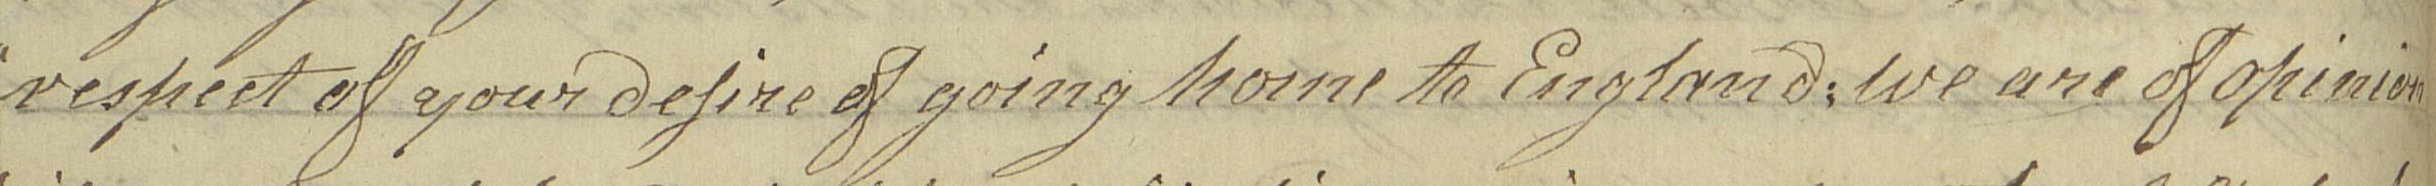respect of your desire of going home to England; We are of opinion
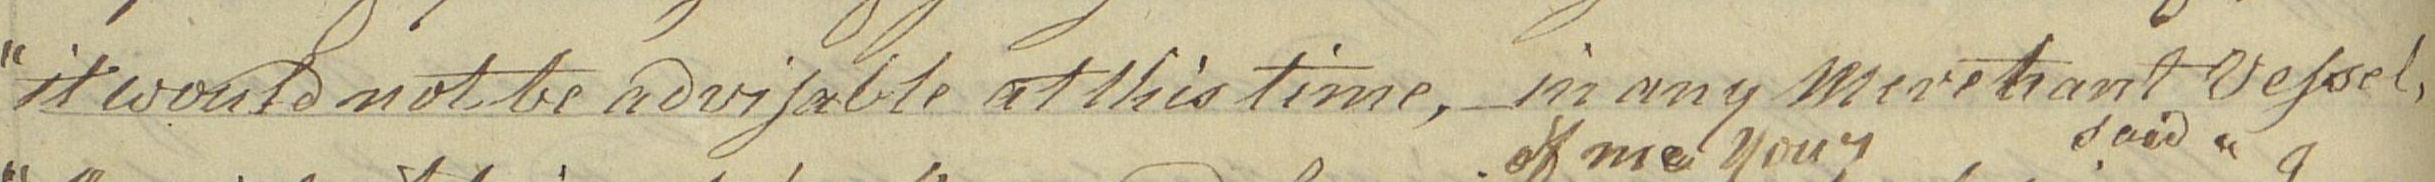"it would not be advisable at this time, in any Merchant Vessel,
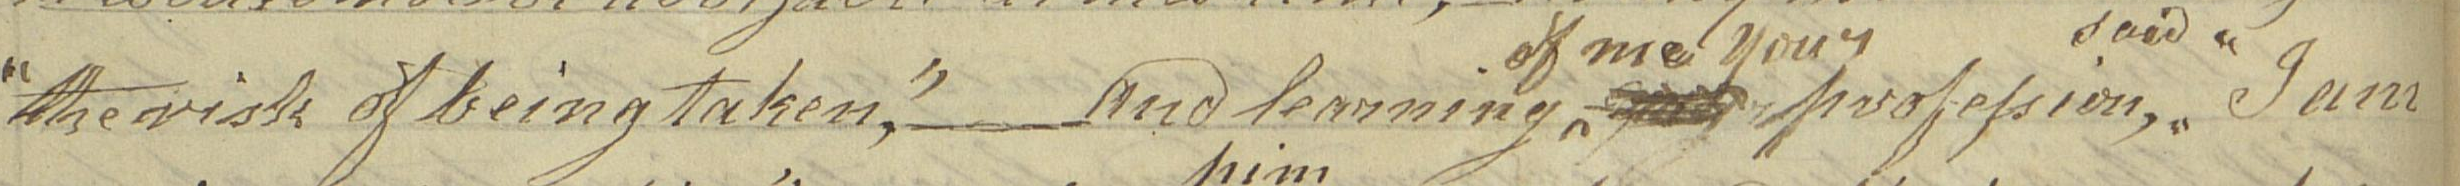"the risk of being taken," and learning ^ you profession, ^ I am
